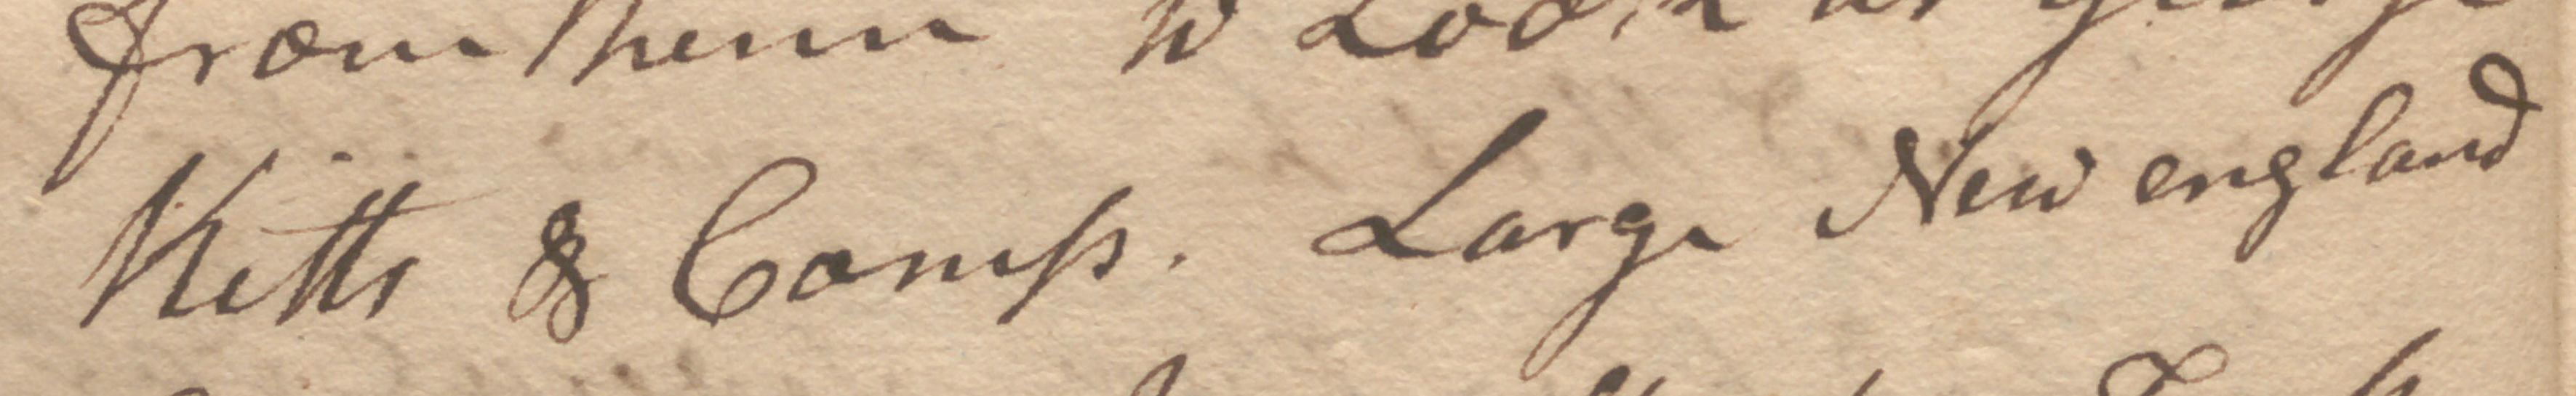Kitts & Comp. Large New england
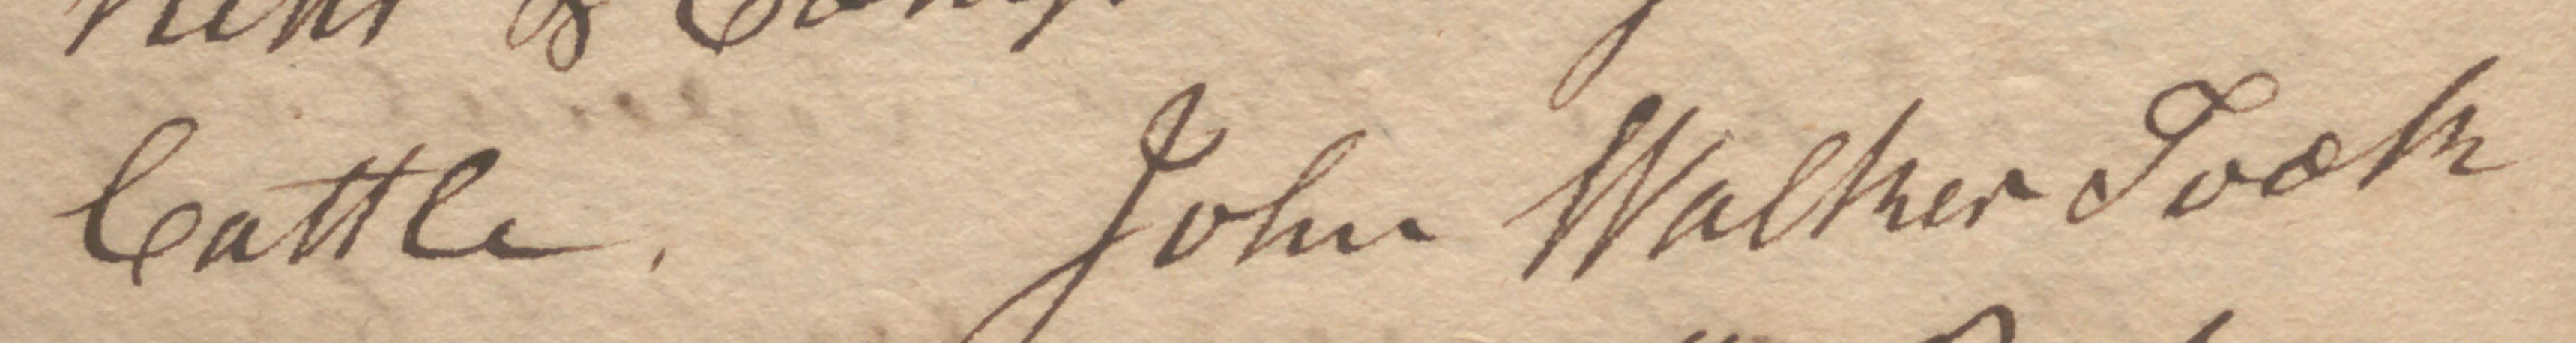Cattle. John Walker Took
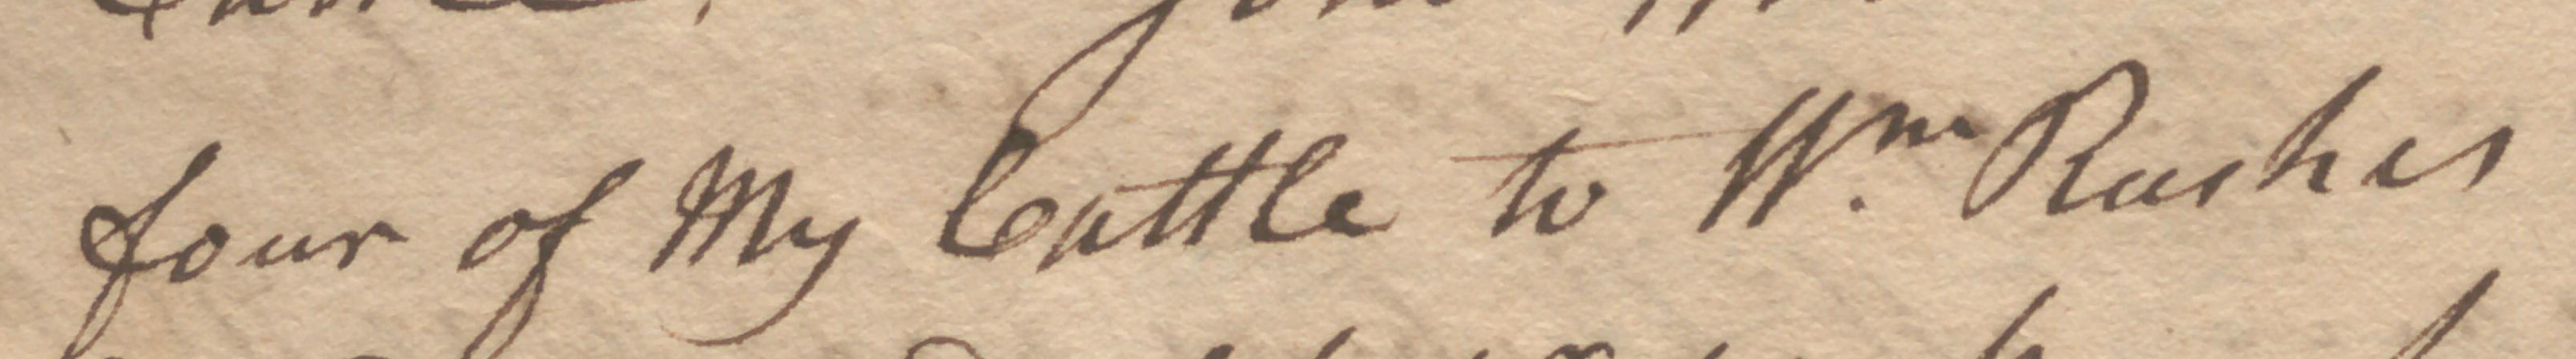four of My Cattle to W^m. Rushes
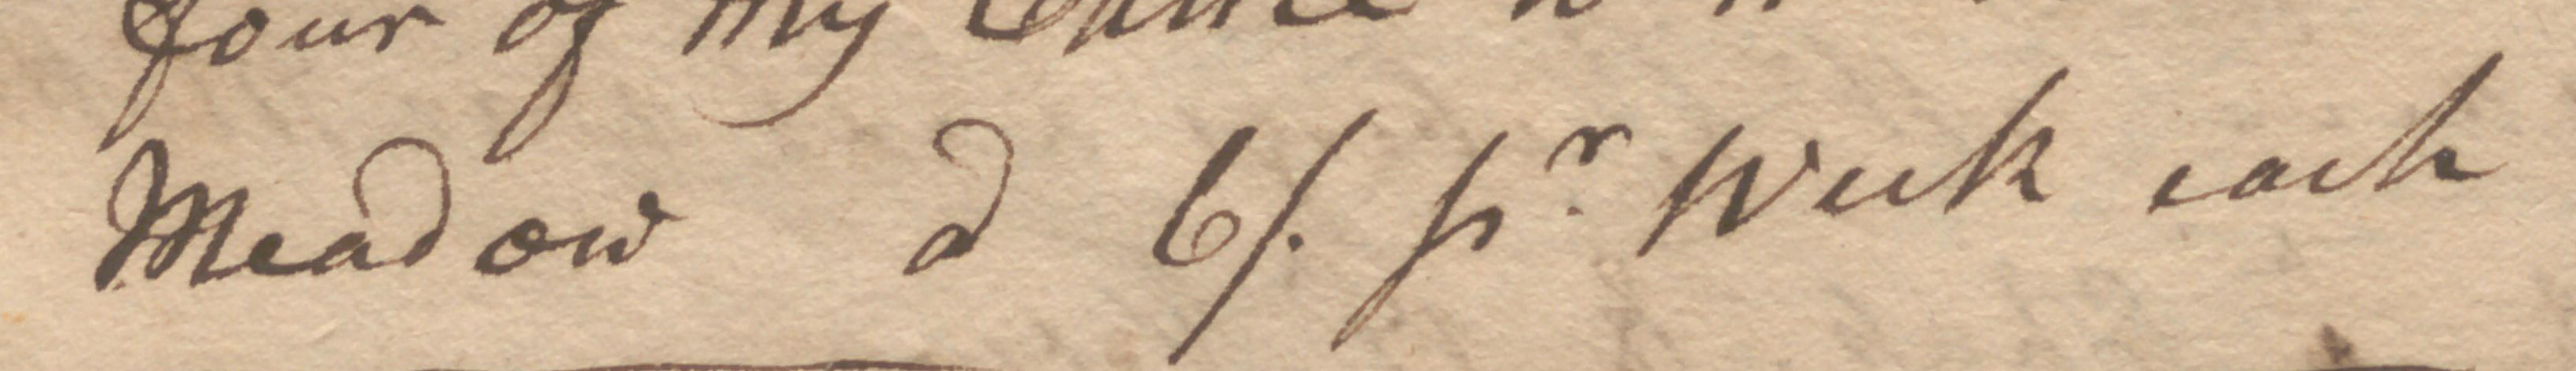Meadowd @ 6s. p^r. Week each
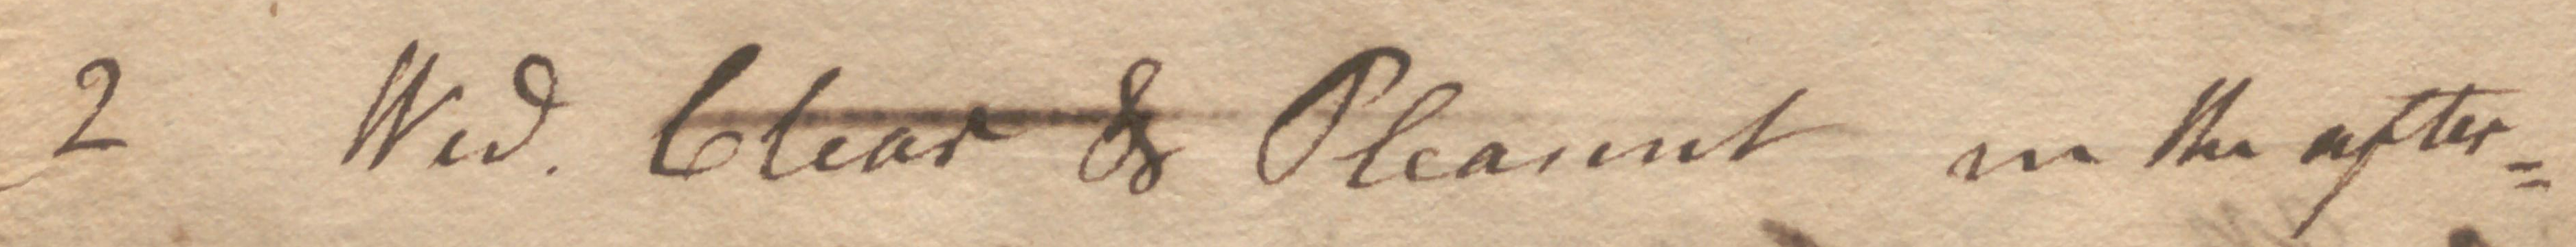2 Wed. Clear & Pleasent in the after
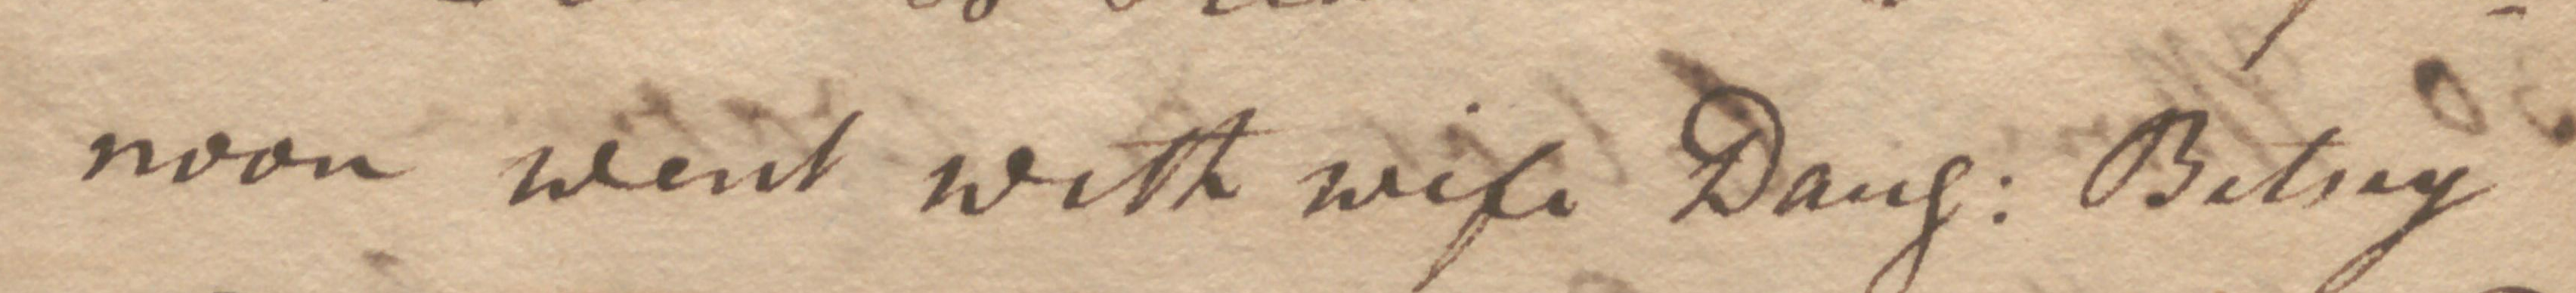noon went with wife Daug^r. Betsey
